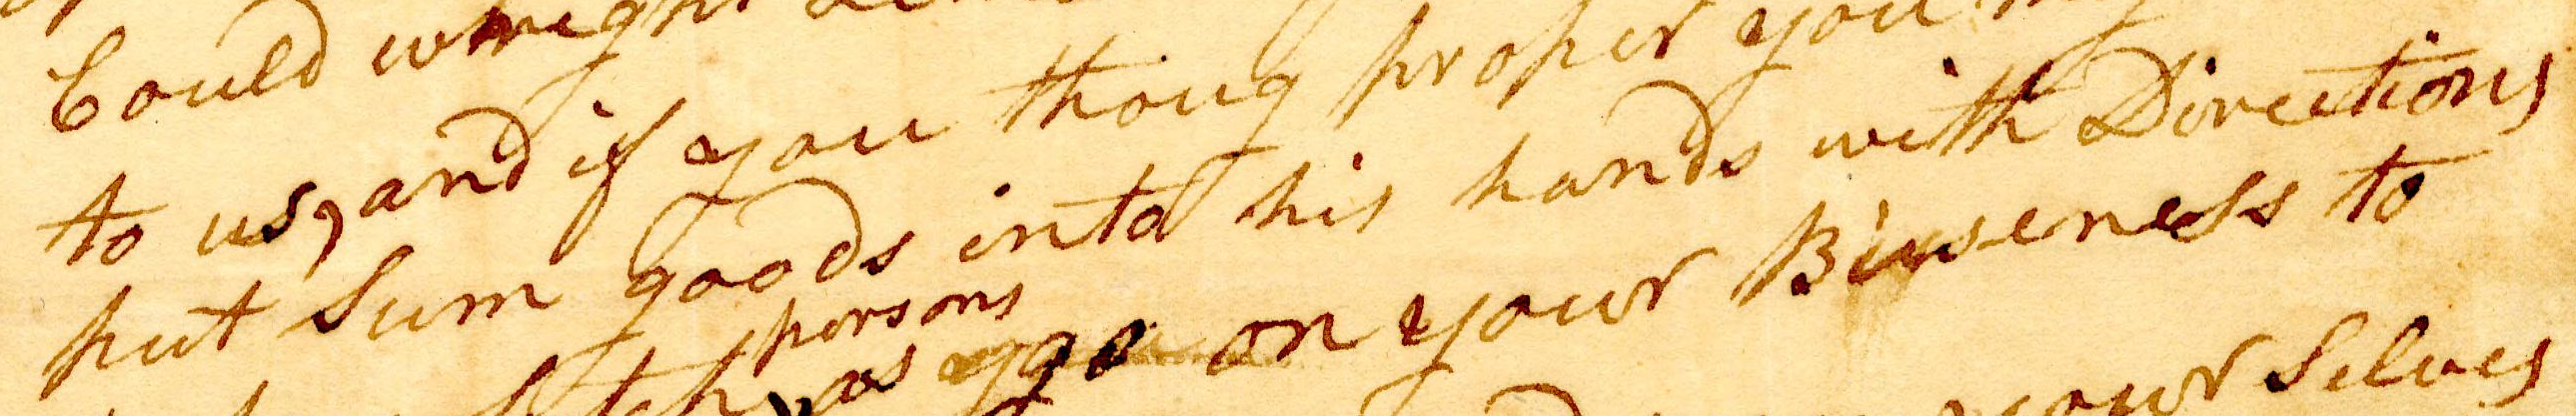put sum goods into his hands with Directions
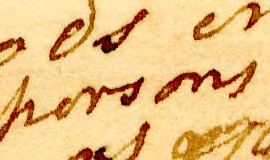persons
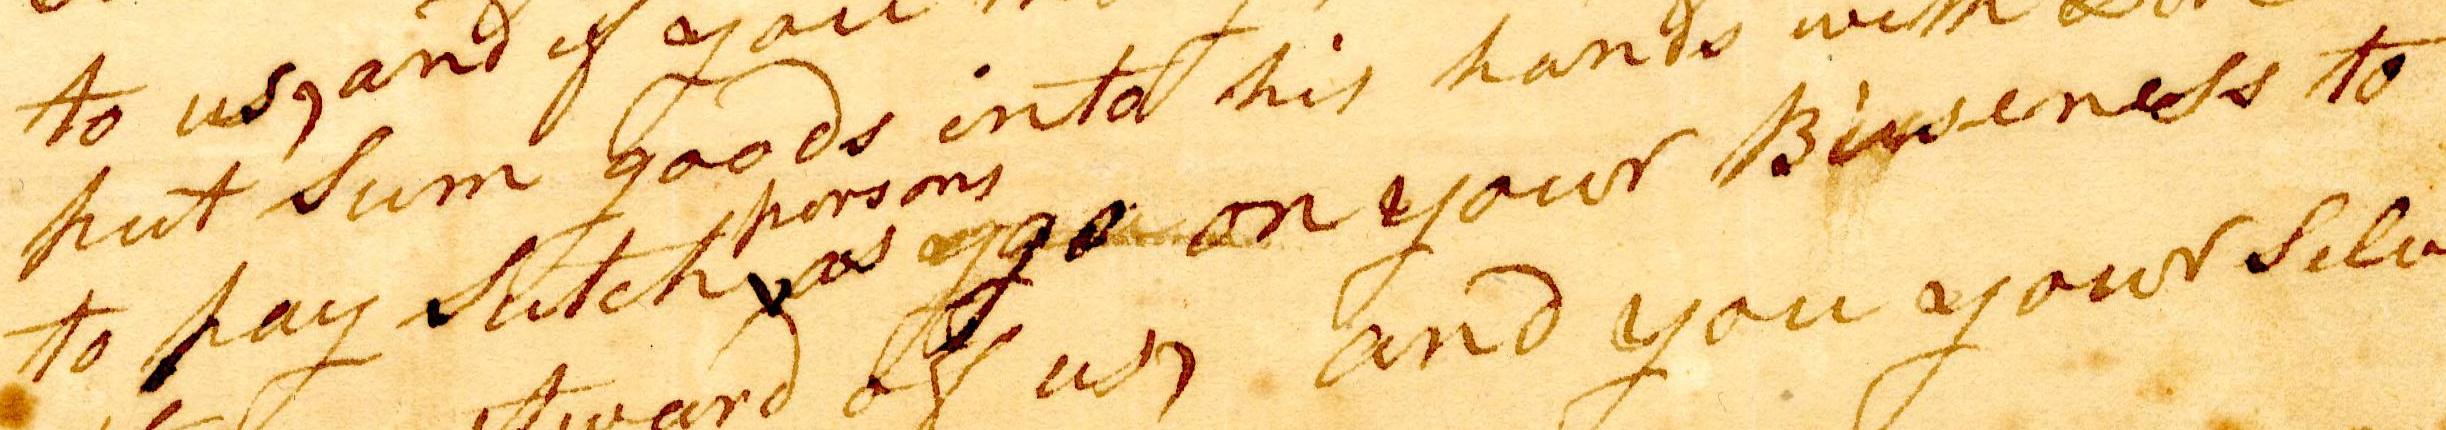to pay sutch ^ as go on your Biseness to
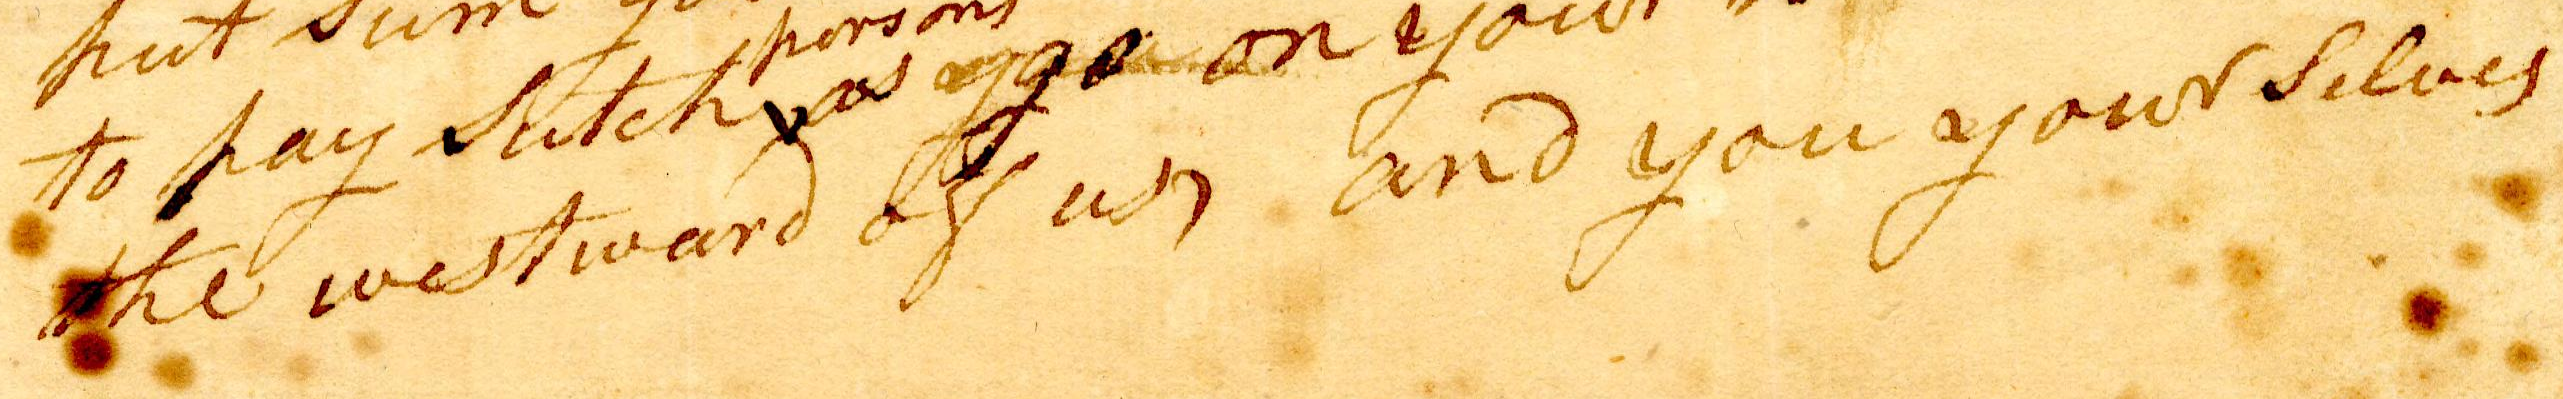the westward of us and you yourselves
